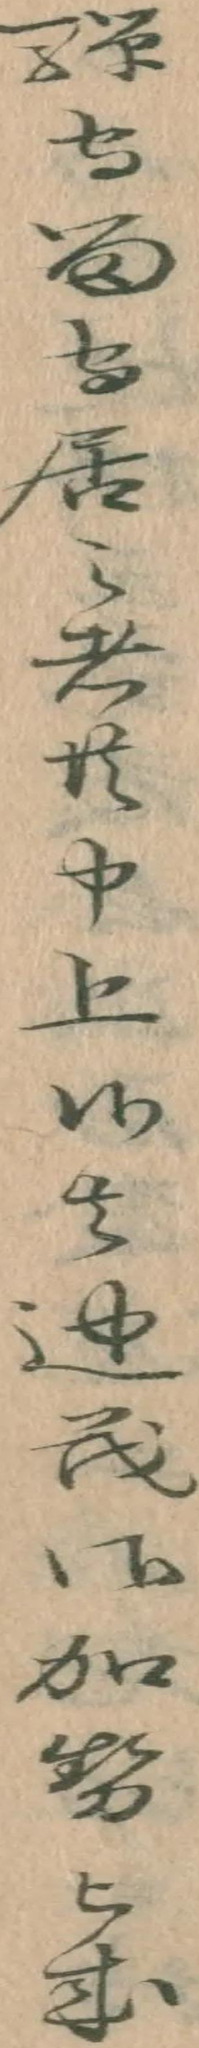騨守留守居之者共申上候者迚茂御加勢被成
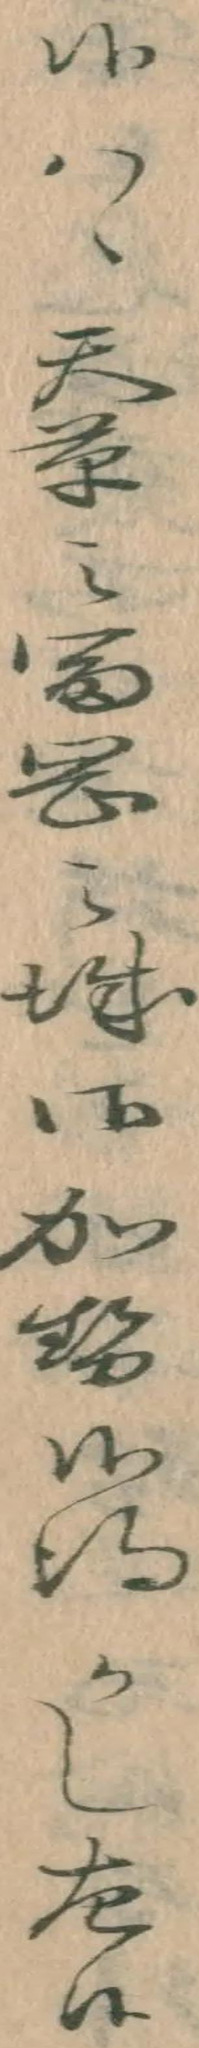候はゝ天草之冨岡之城御加勢候得かし左候
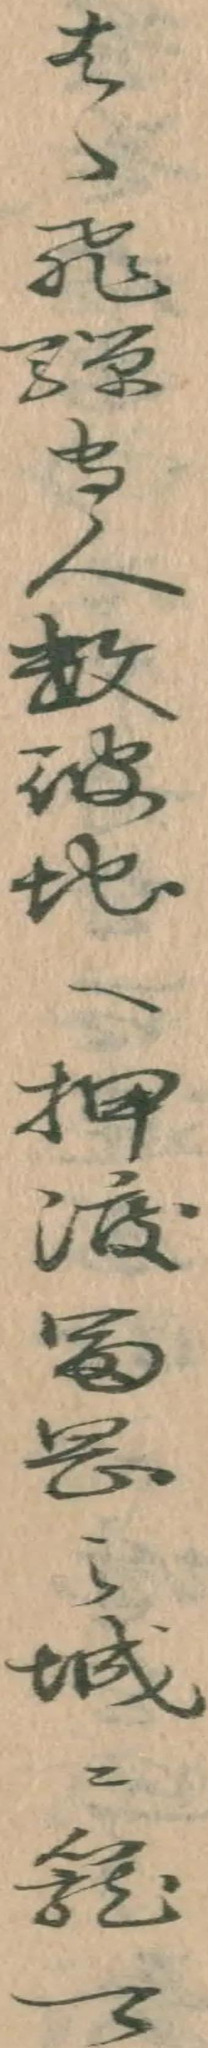はゝ飛騨守人数彼地へ押渡冨岡之城に籠て
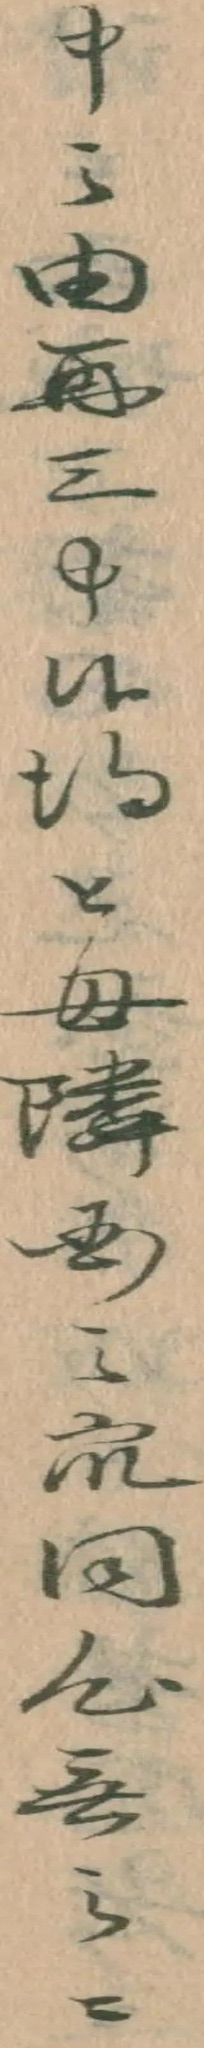申之由再三申候得と母隣国之衆同心無之に
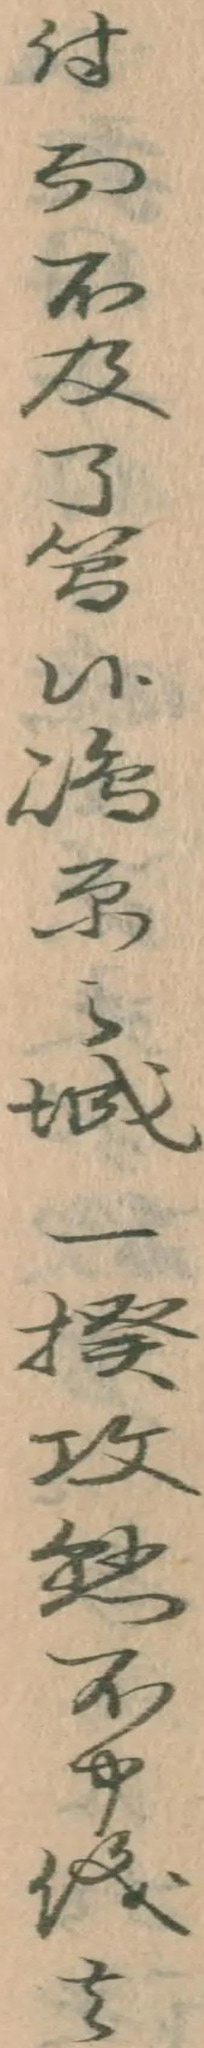付而不及了簡候島原之城一揆攻懸不申儀者
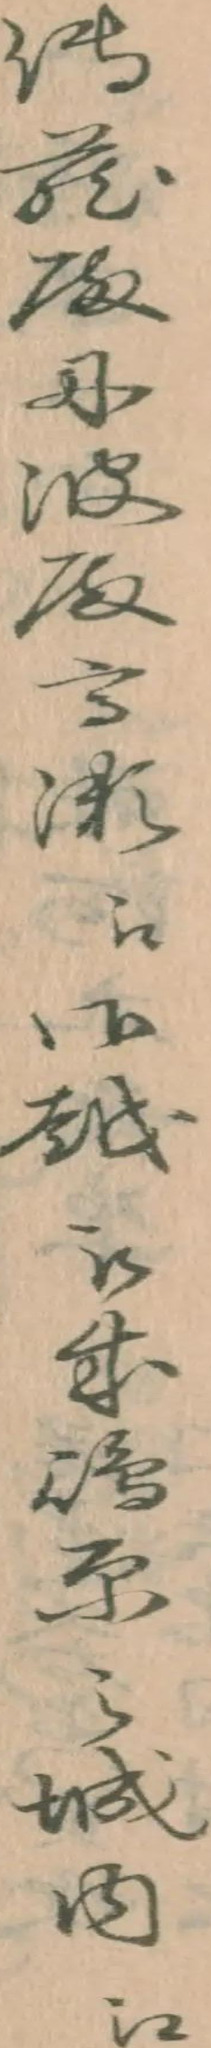伝蔵殿丹波殿高瀬江御越被成島原之城内江
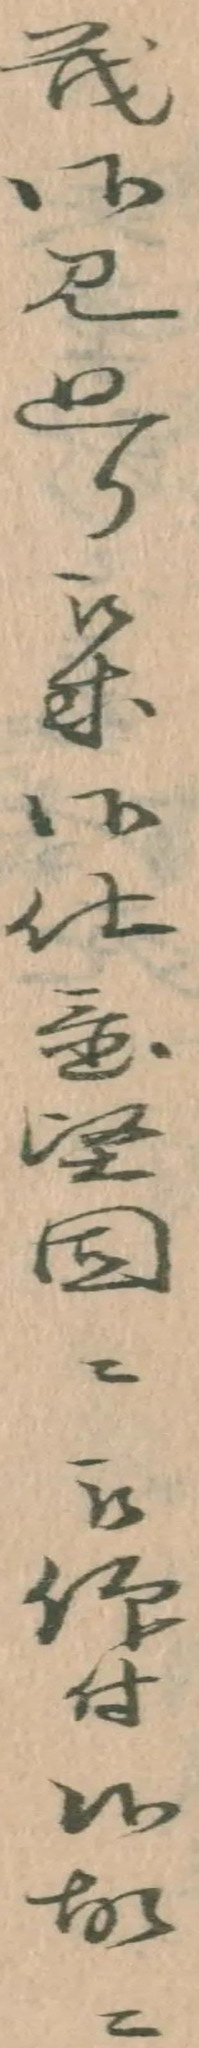茂御見廻り被成御仕置堅固に被仰付候故に
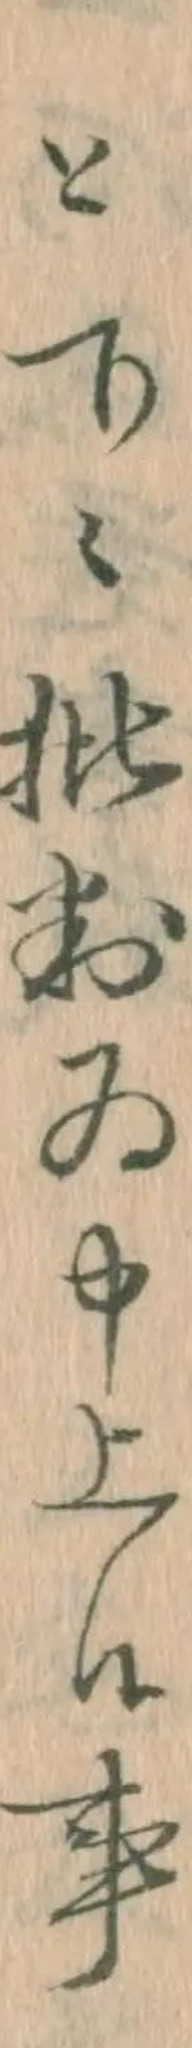と下々批判ゐ申上候事
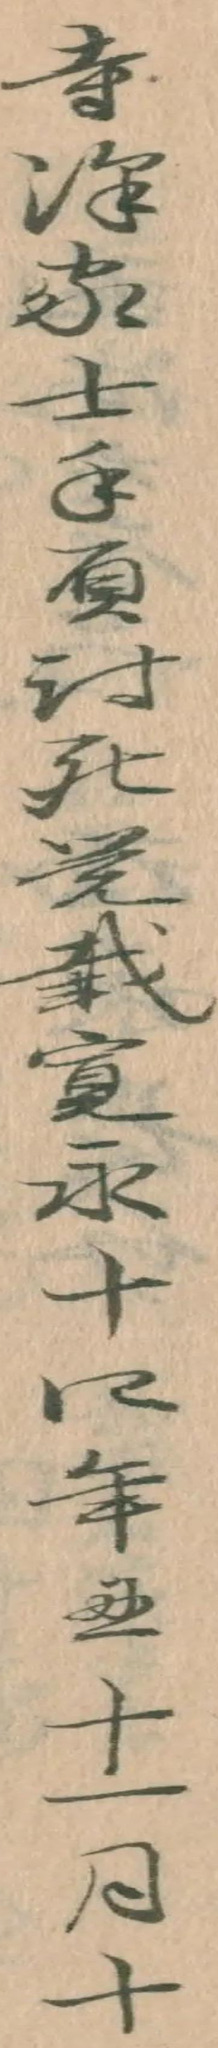寺沢家士手負討死覚載寛永十四年丑十一月十
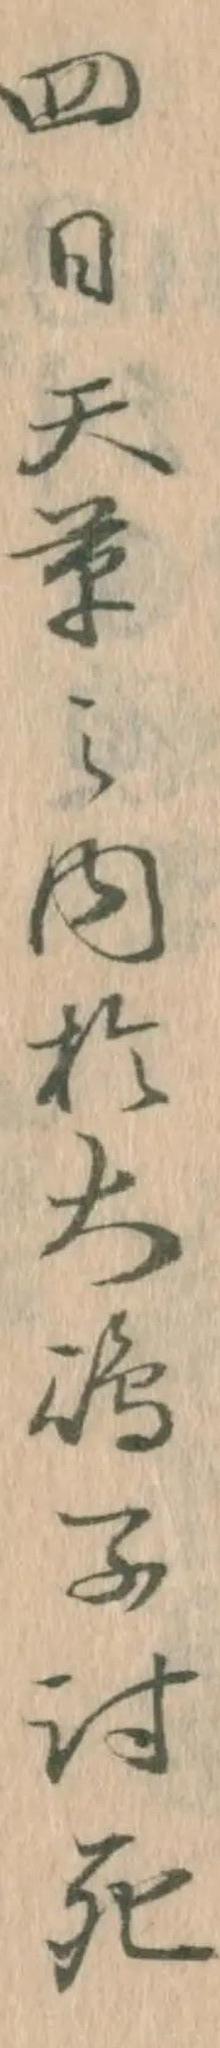四日天草之内於大島子討死
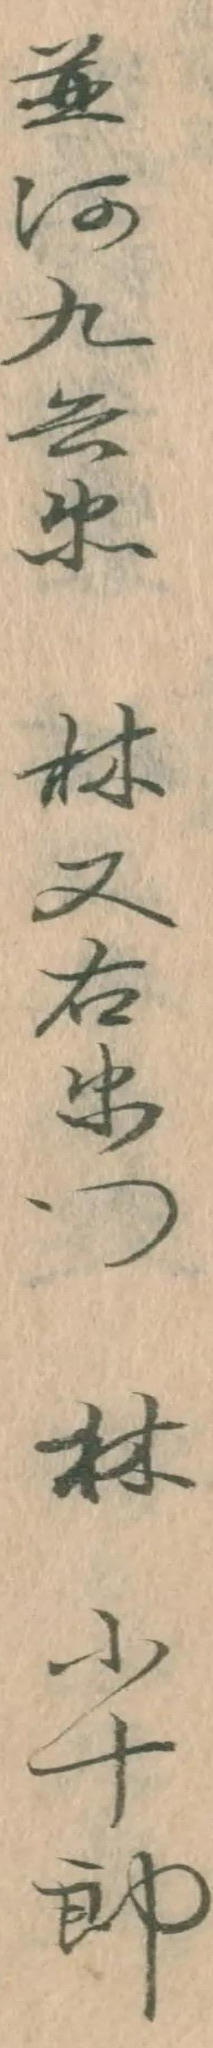並河九兵衛林又右衛門林小十郎
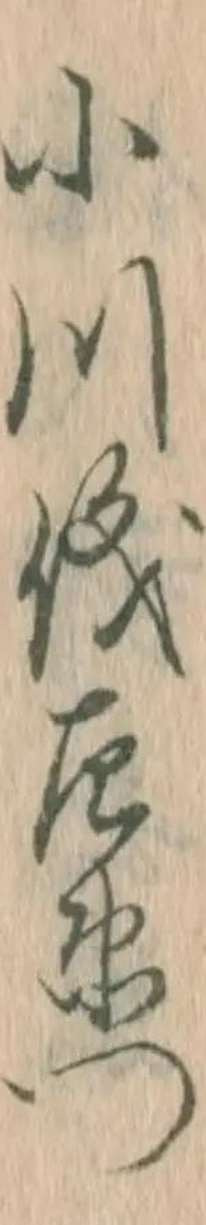小川儀左衛門
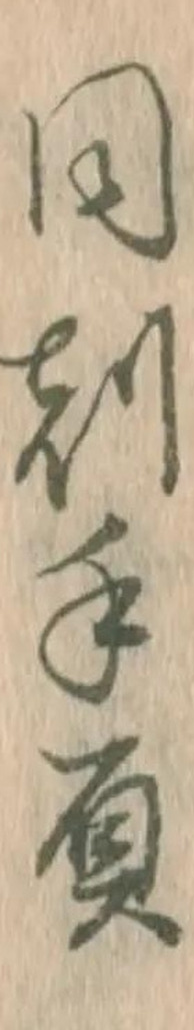同刻手負
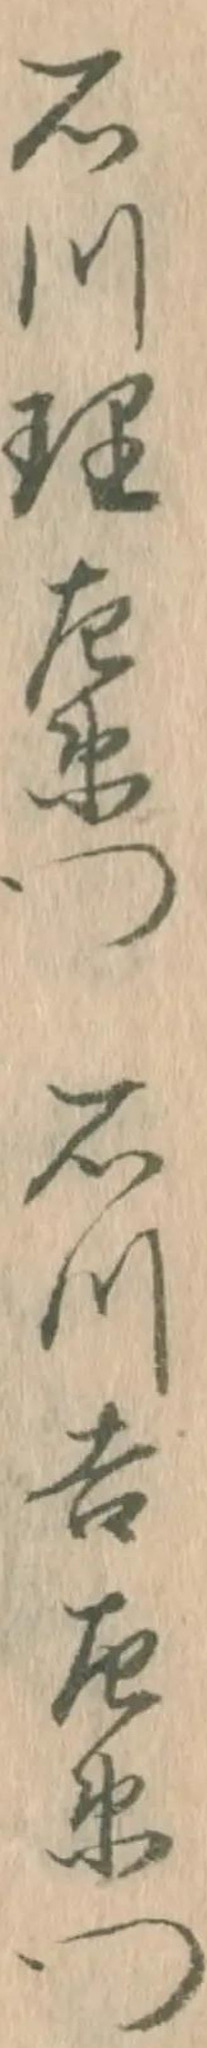石川理左衛門石川吉左衛門
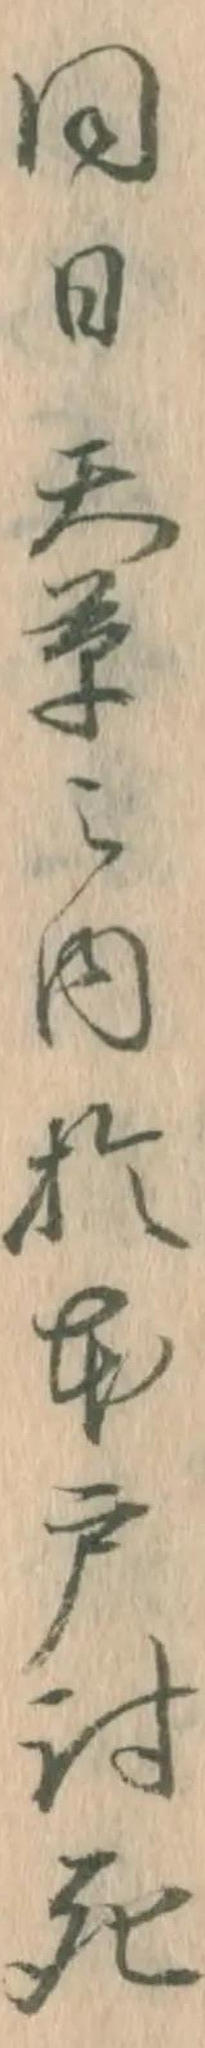同日天草之内於本戸討死

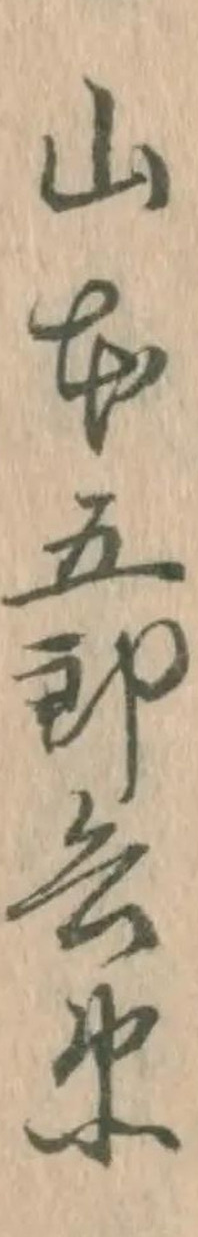山本五郎兵衛
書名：切支丹御退治記 49巻. [2]
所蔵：国立国会図書館 National Diet Library, JAPAN
